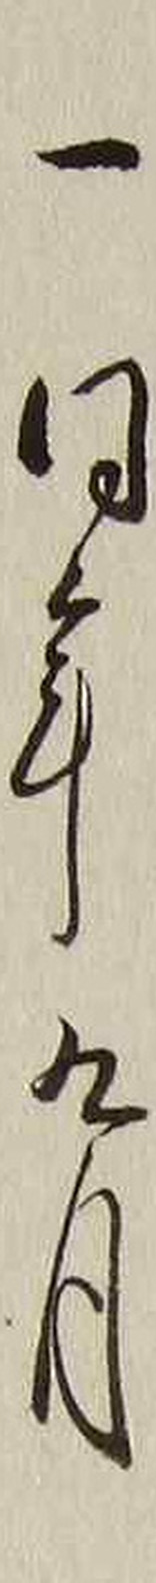一同年九月
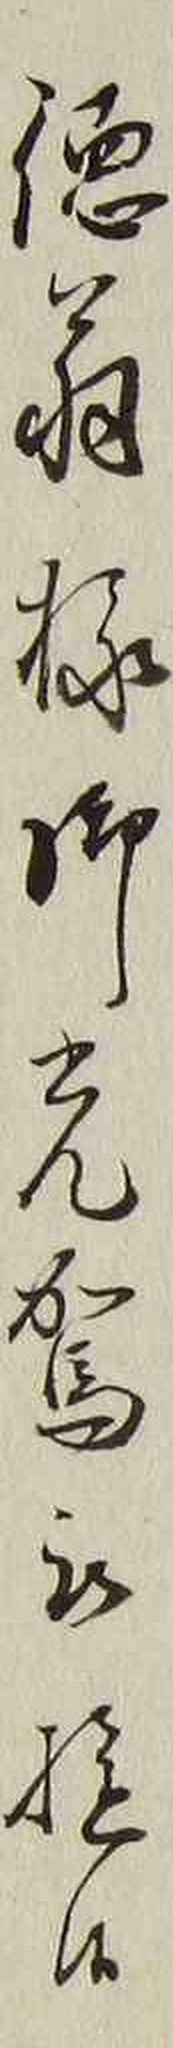徳翁様御光駕被遊候
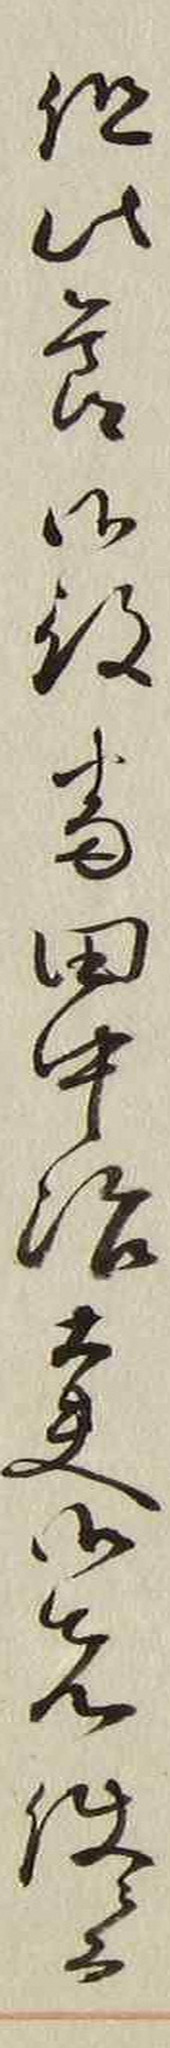但此節御役番田中治太夫御先使に而
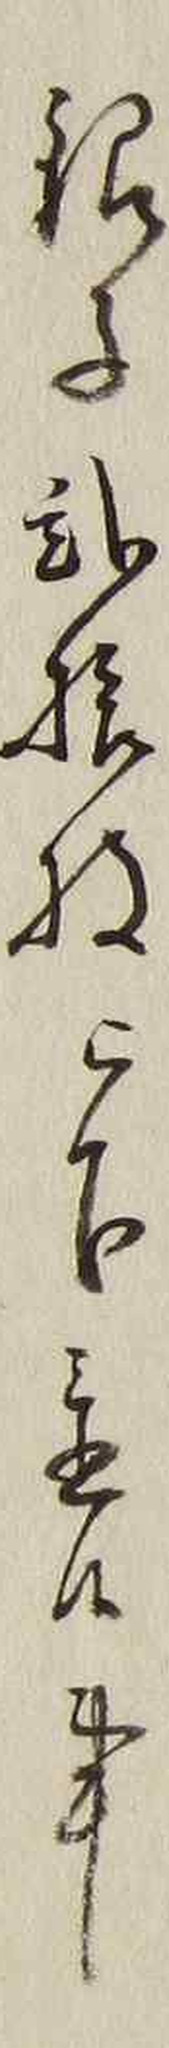銀子弐拾枚被下置候事

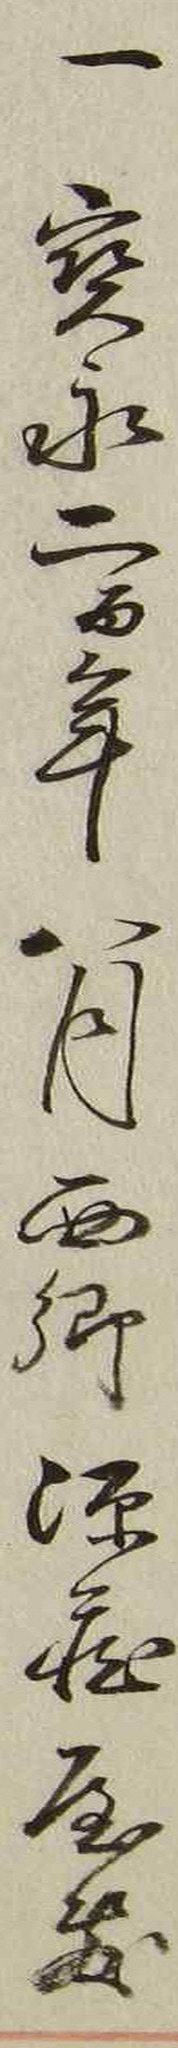一宝永二年酉月八月西郷源蔵屋敷
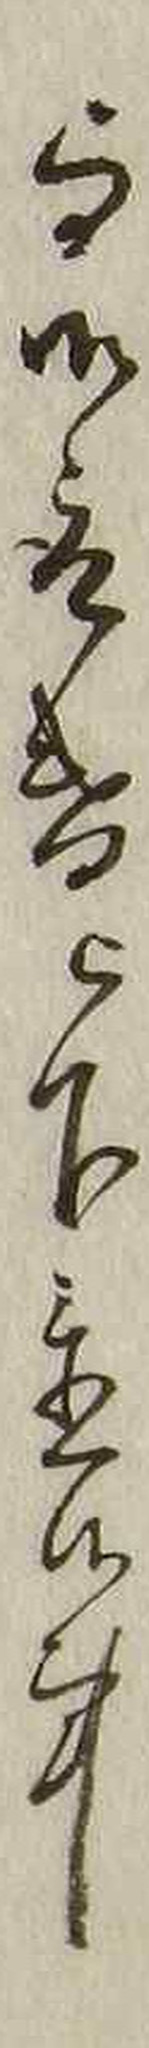と御取替被下置候事
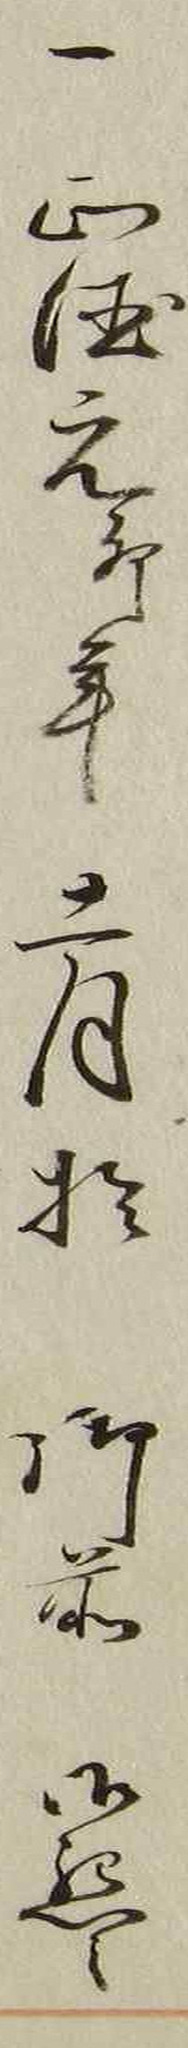一正徳元卯年十一月於御前御懇之
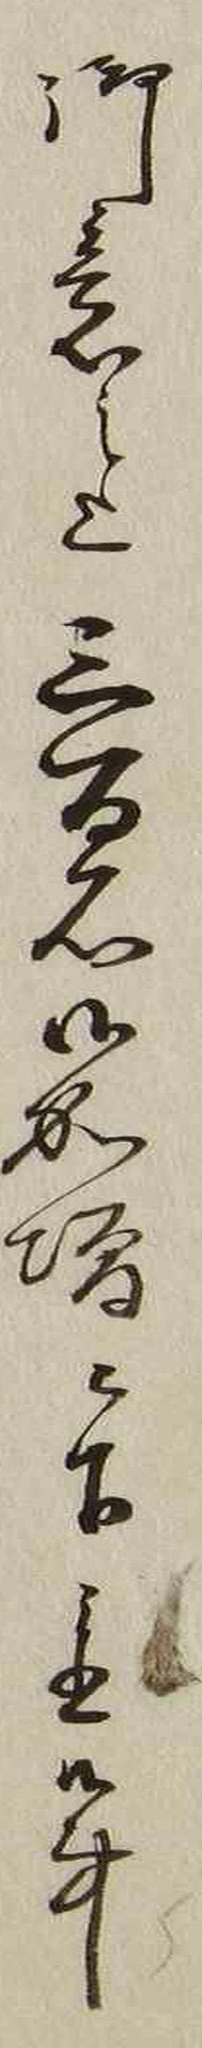御意之上三百石御加増被下置候事
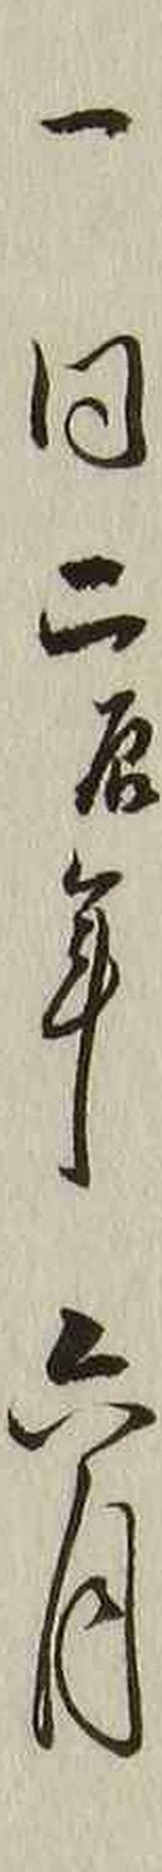一同二辰年六月
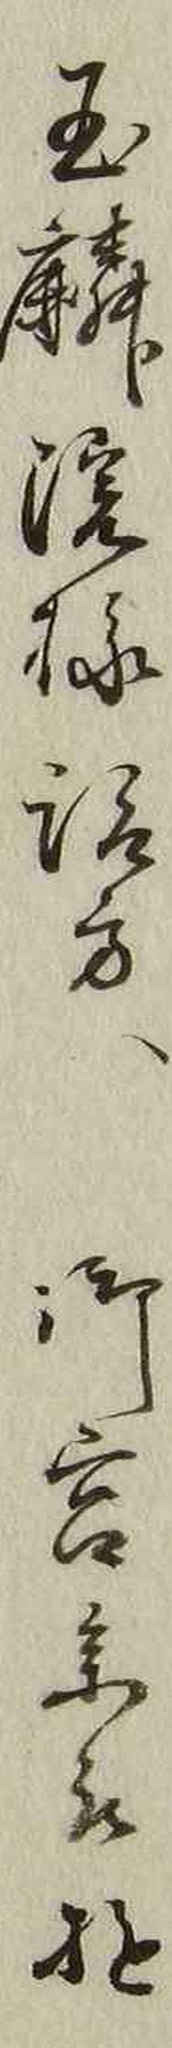玉麟院様詣方へ御宮参被遊
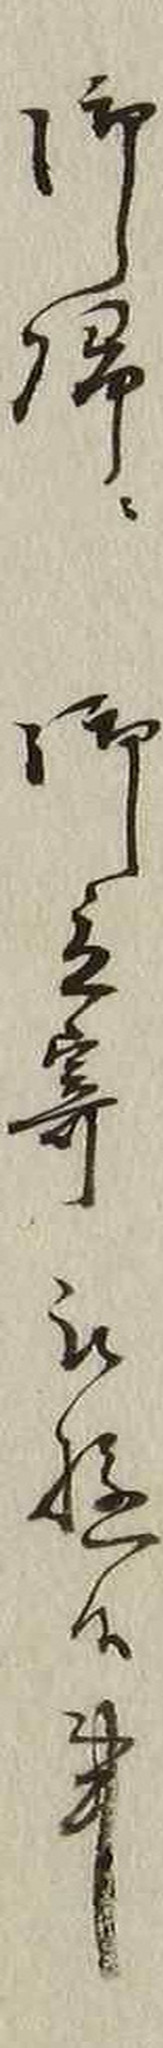御帰に御立寄被遊候事
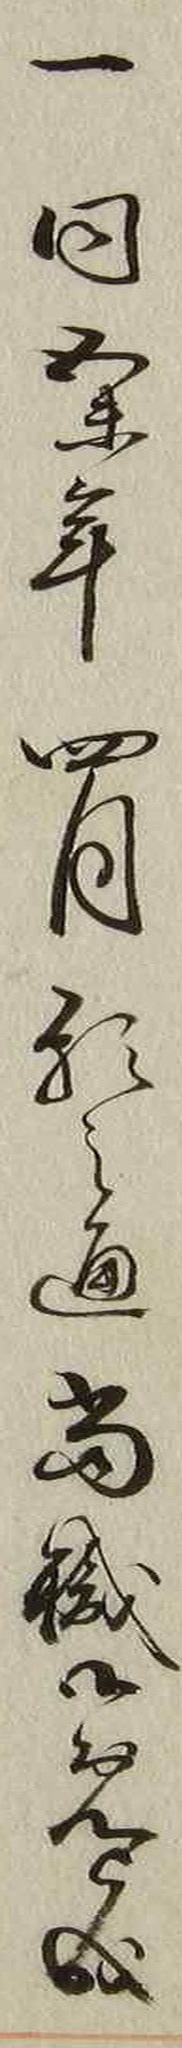一同五未年四月願之通当職御免成
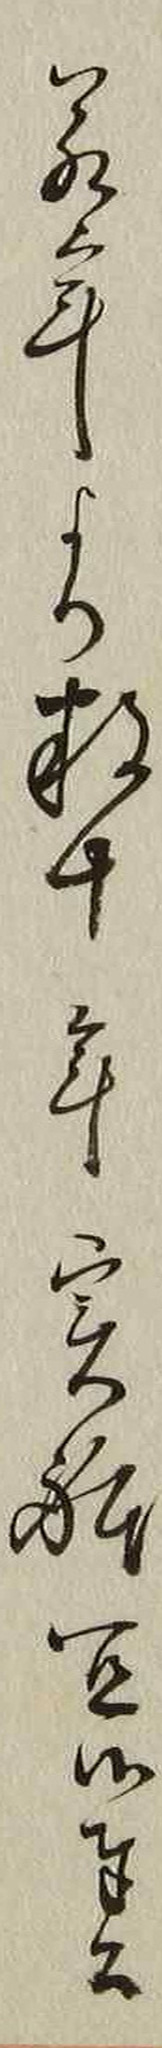若年より数十年実体宜御奉公
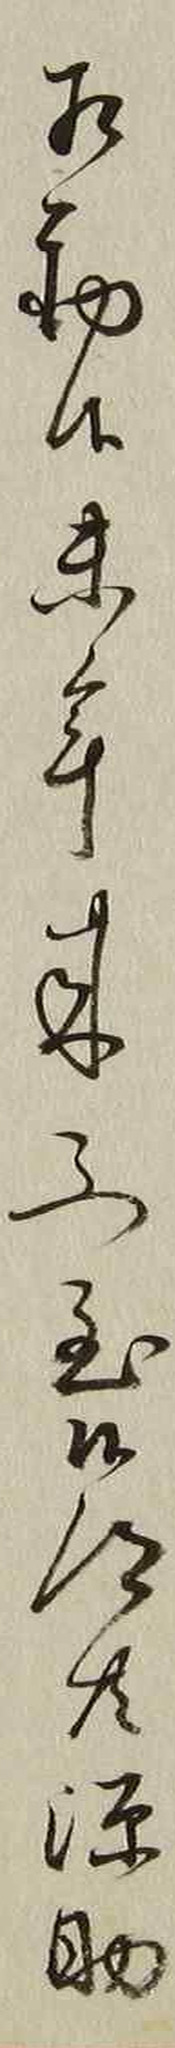相勤候未年来不至候得共源助
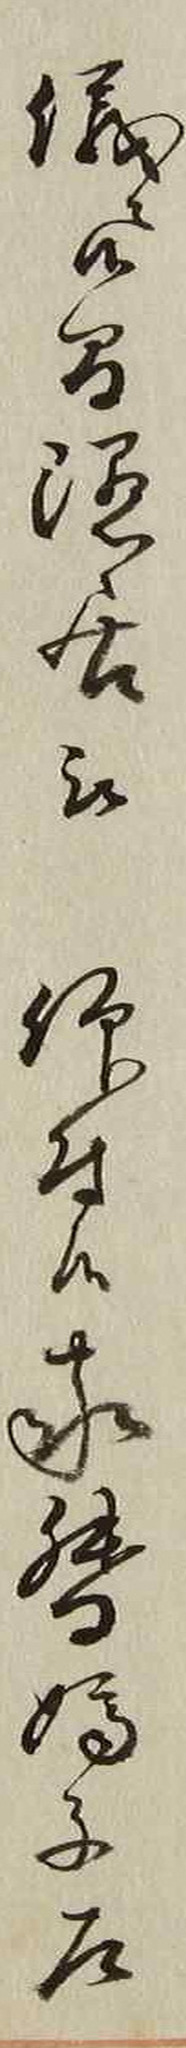儀に候間隠居被仰付候家督嫡子左
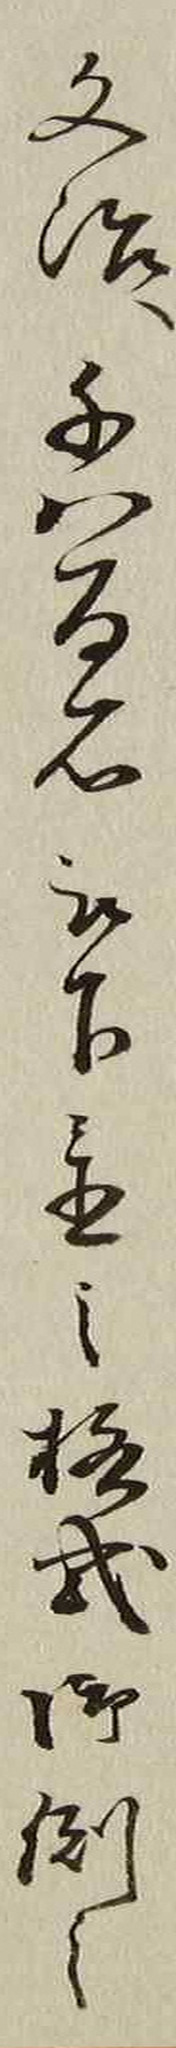文治へ千八百石被下置之格式御側之
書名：諸士系譜　巻之159　な之部1
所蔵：会津若松市立会津図書館
